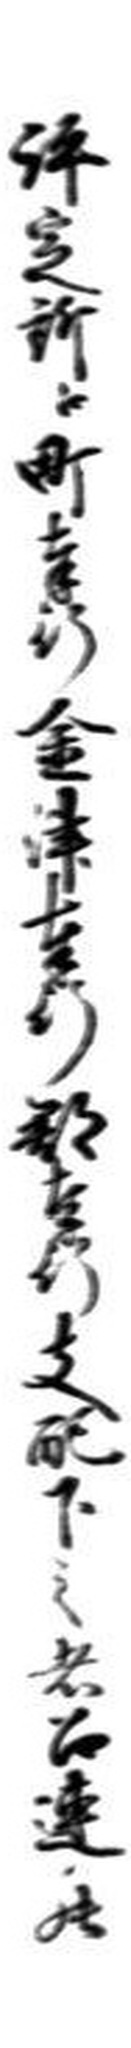評定所江町奉行金津奉行郡奉行支配下之者召連罷
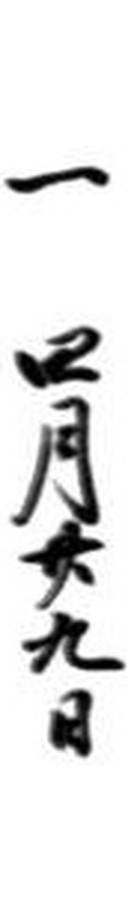一四月廿九日
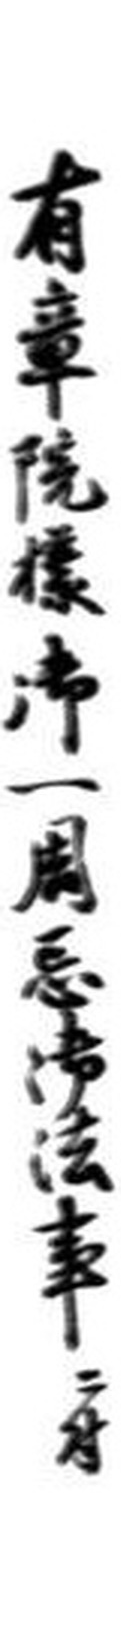有章院様御一周忌御法事ニ付
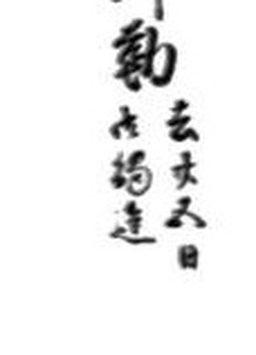御触達

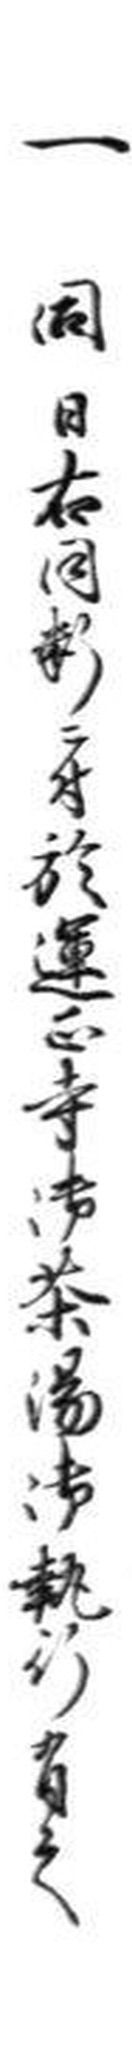一同日右同断ニ付於運正寺御茶湯御執行有之
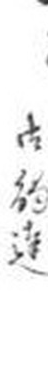御触達
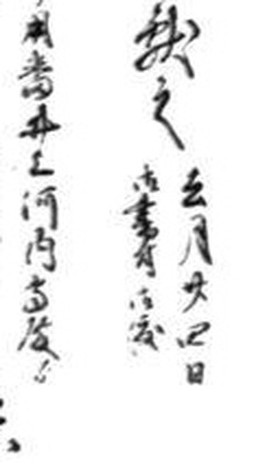御書付御渡
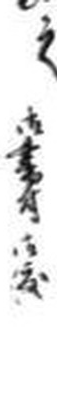御書付御渡
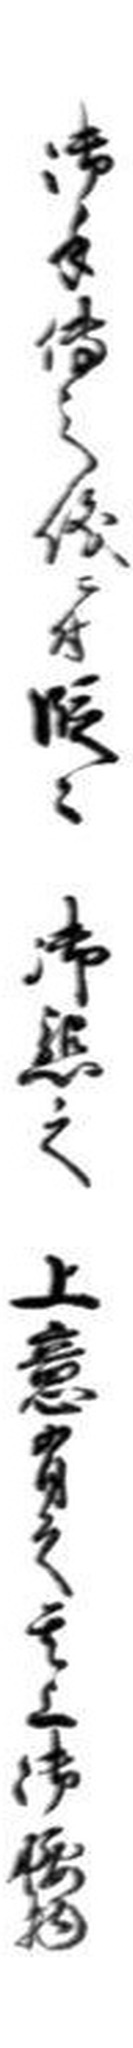御手伝之儀ニ付段々御懇之上意有之其上御腰物
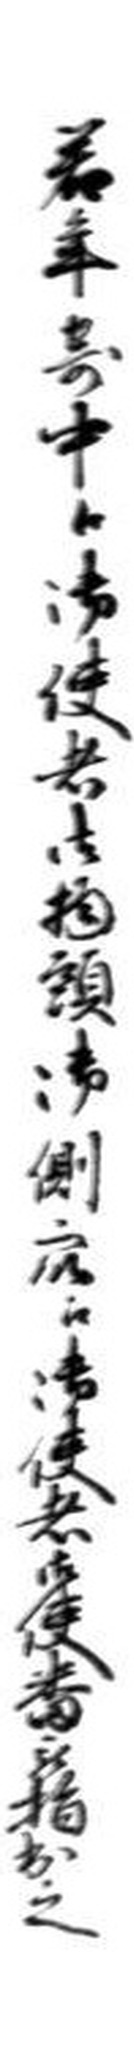若年寄中江御使者御物頭御側衆江御使者御使番被指出之
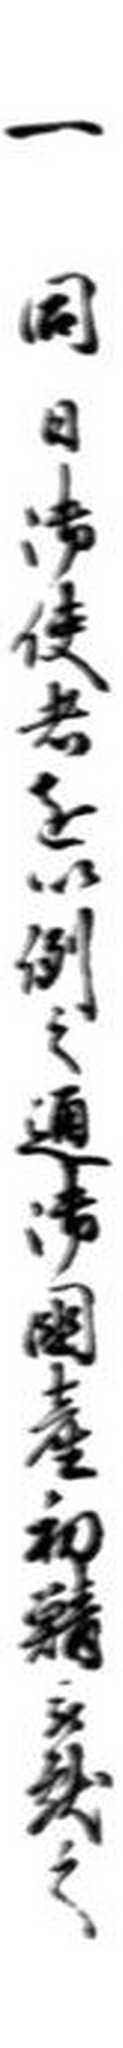一同日御使者を以例之通御国産初鯖被献之
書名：家譜 三十二 吉邦公 従享保二年到享保三年
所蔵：福井県文書館 Fukui Prefectural Archives
